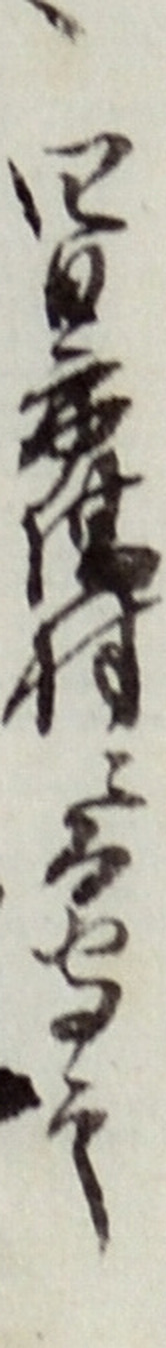四日市場村ニ而守之
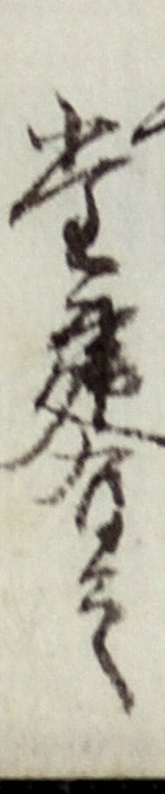宮建有之
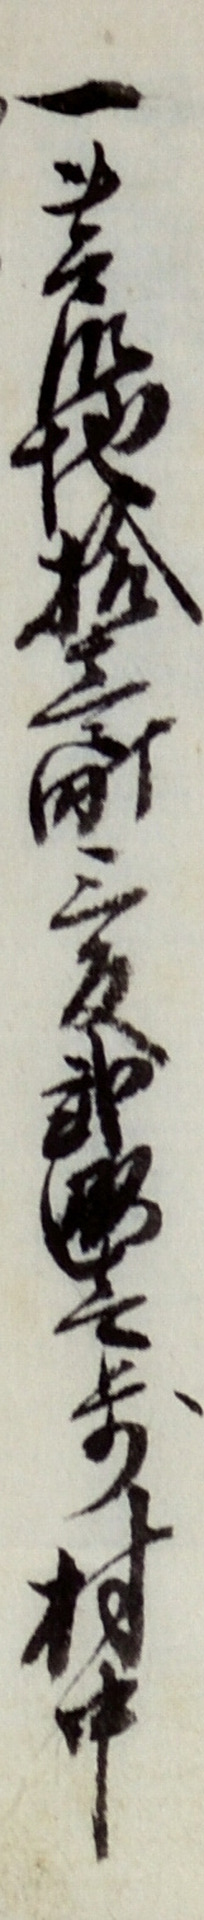一荒地拾壱町参反弐畝壱歩村中
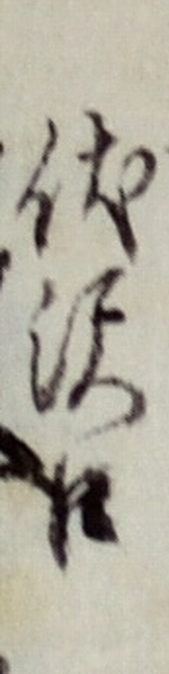伏沢口
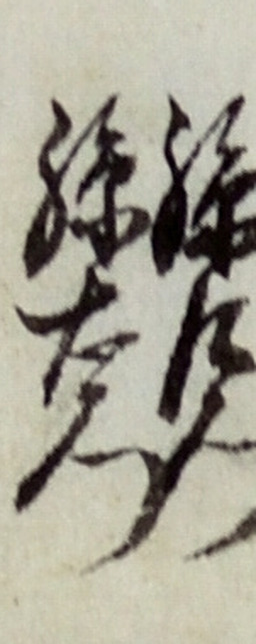源右衛門

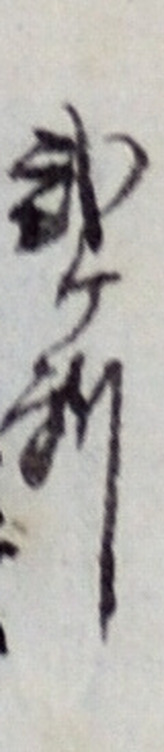弐ヶ所
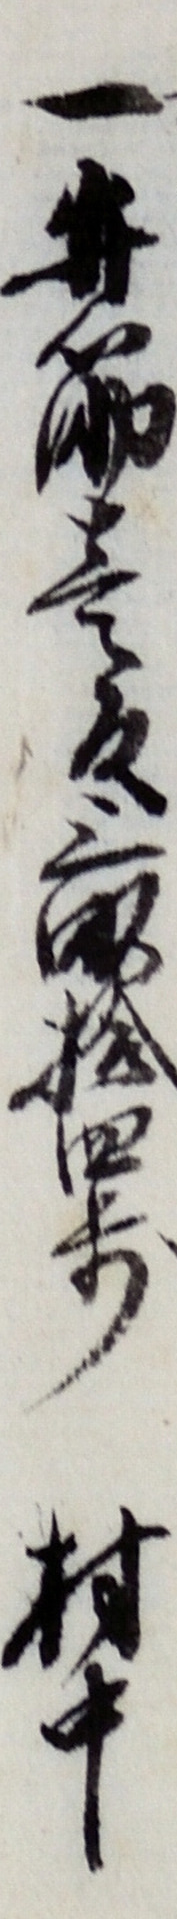一井筋壱反三畝拾四歩村中
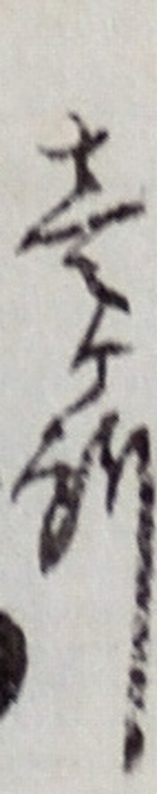壱ヶ所
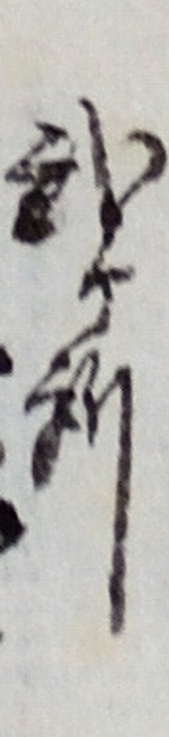弐ヶ所
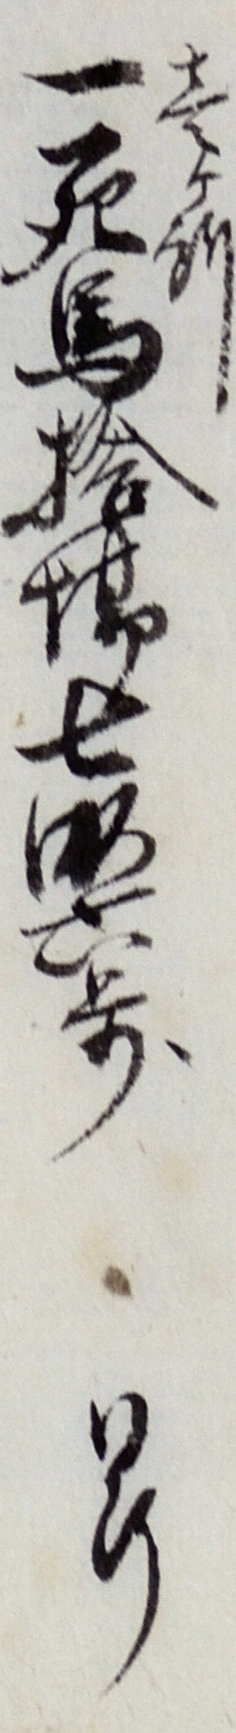一死馬捨場七畝六歩同断
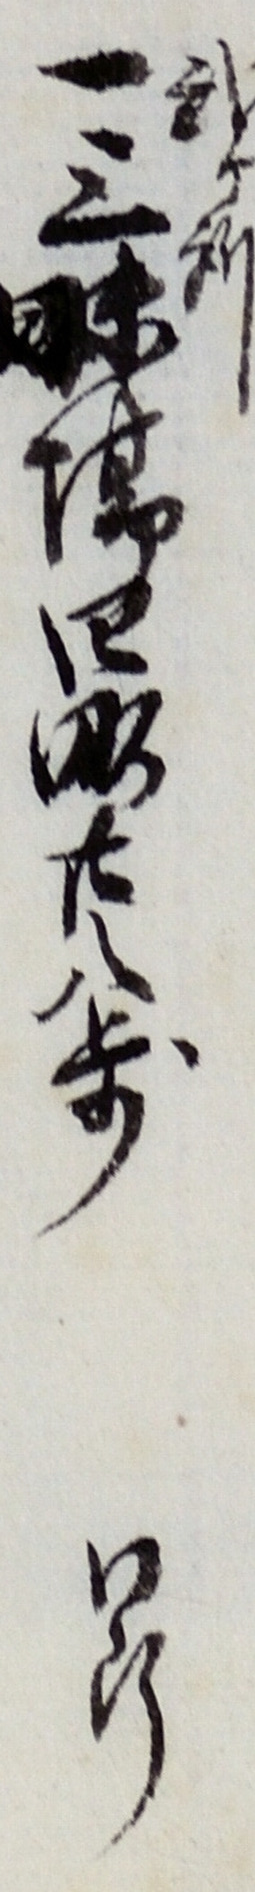一三昧場四畝廿八歩同断
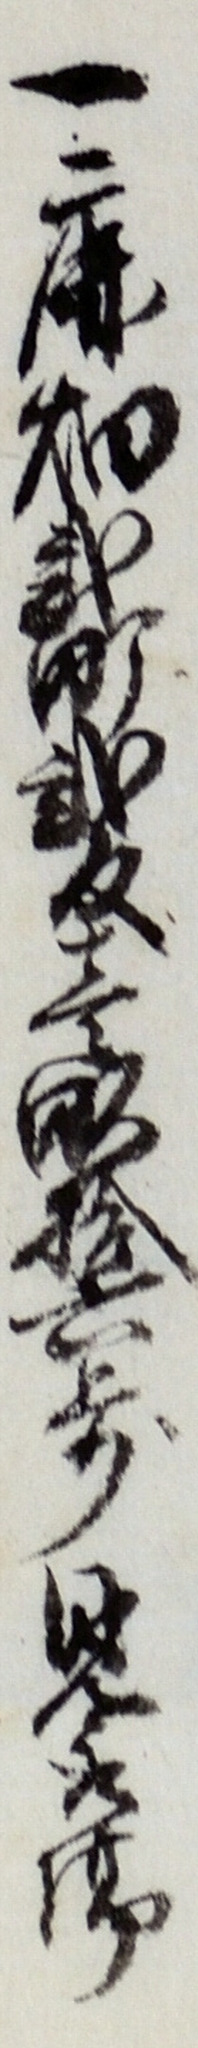一麻畑弐町弐反壱畝拾六歩見取場
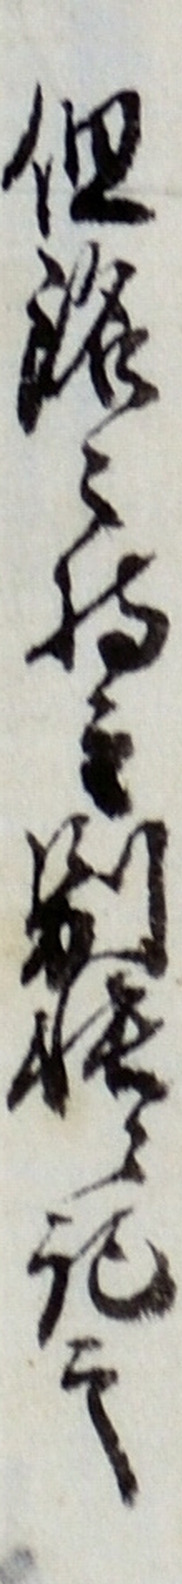但銘々持主別帳ニ記之
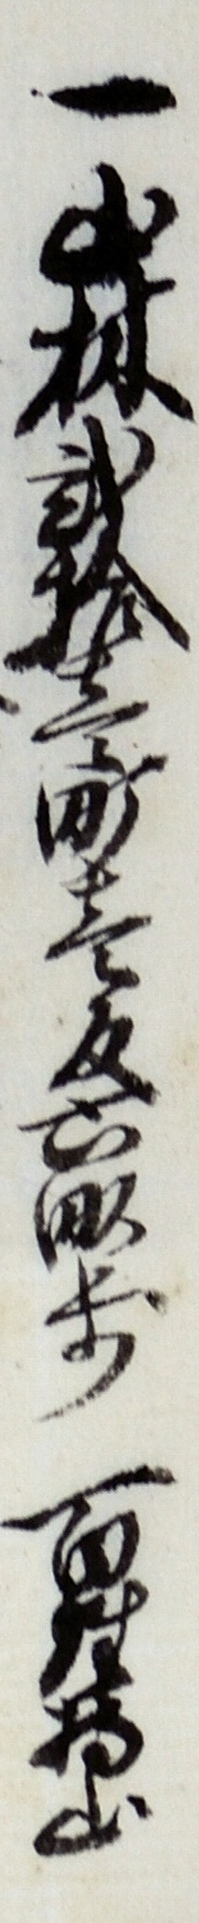一山林弐拾壱町壱反六畝歩百姓持山
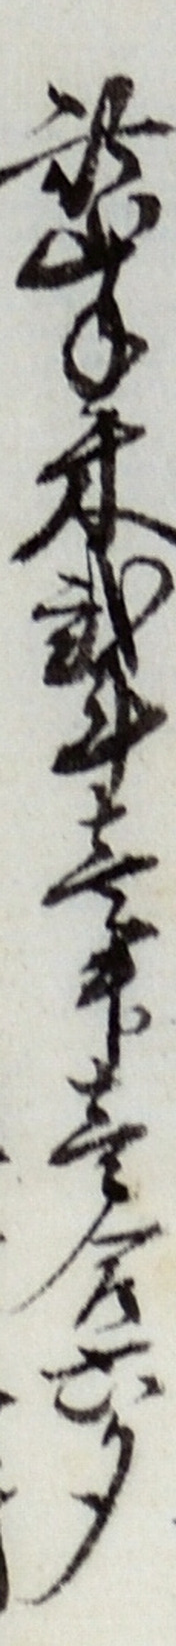此山手米弐斗壱升壱合六夕
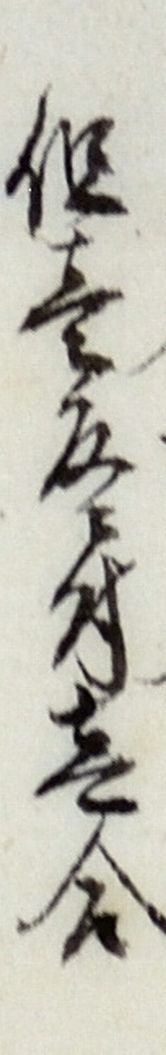但壱反ニ付壱合
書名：御領分中山林社地手控
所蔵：伊那市立高遠町図書館・合同会社AMANE
